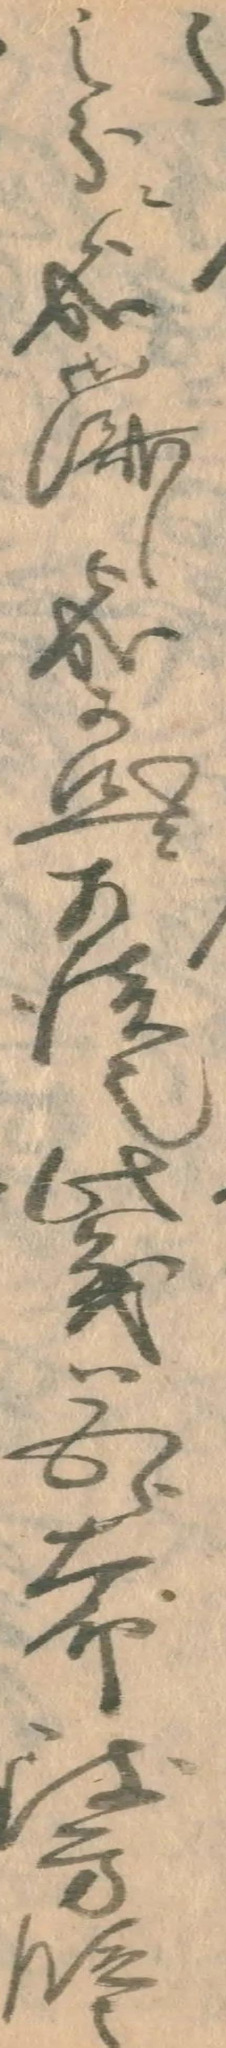之分ニ被成御済し被成可然と相談也此義ハ五郎大郎致方段々
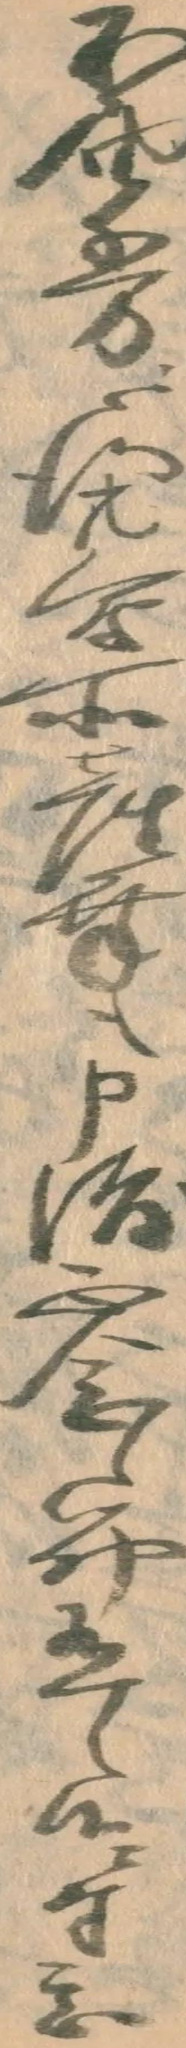不届千万ニ候得共会所産幸も申渡不念之筋有之候ニ付甚
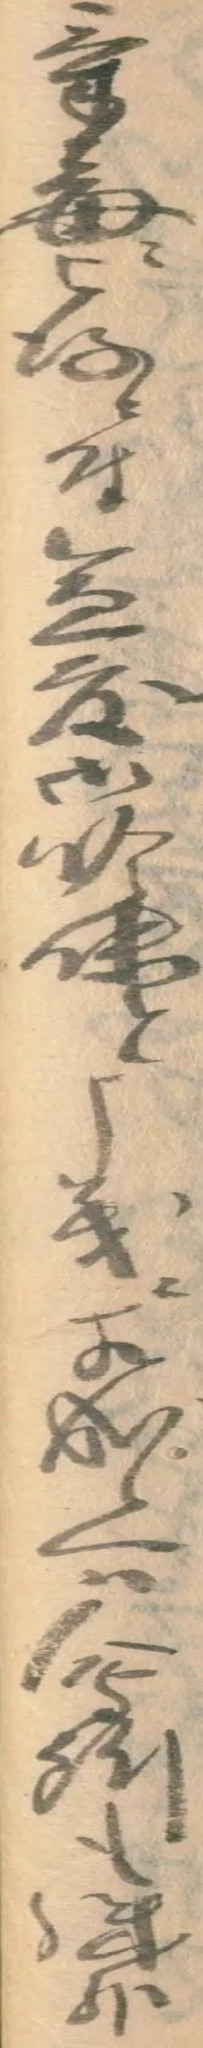気毒ニ被存ニ付急度御吟味と申義ニ相成候へハ会所も殊外
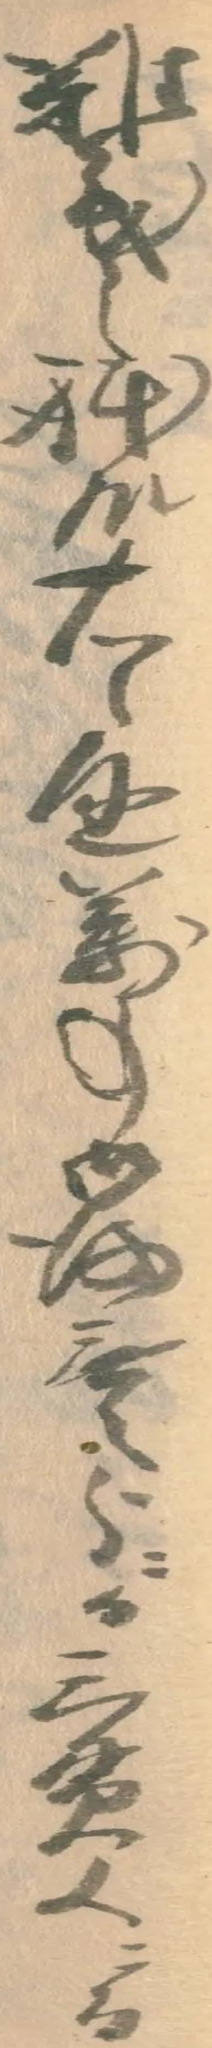難義之体故右之通万事御存無之分ニ而三貫文ニ而
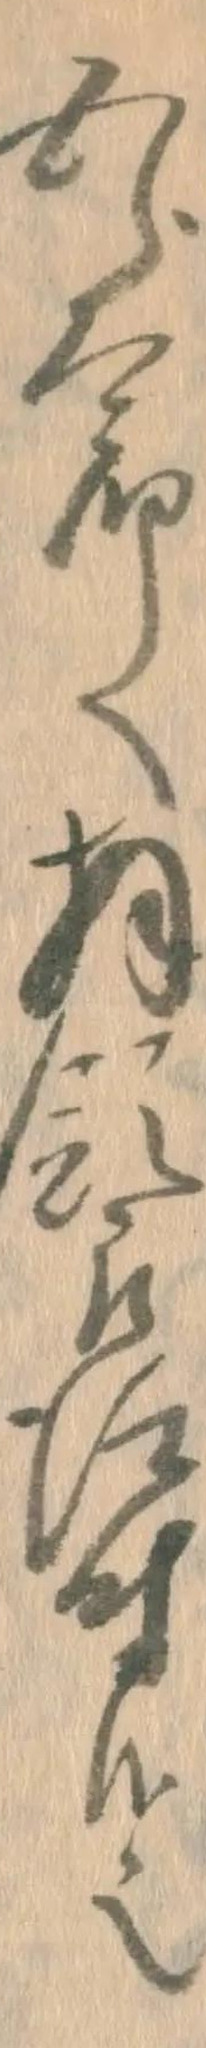五郎太郎へ拝領被仰付候也
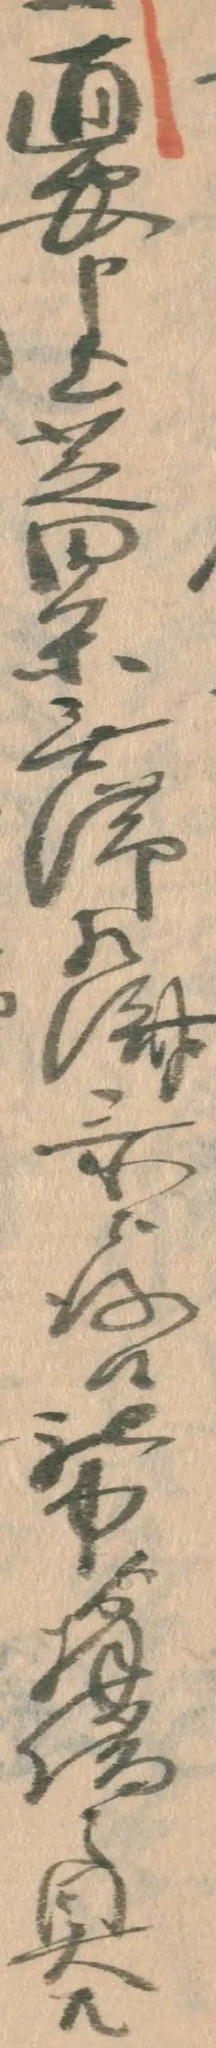一直安申上芝田楽無滞相済忝被存候社中ゟ拝借之具共
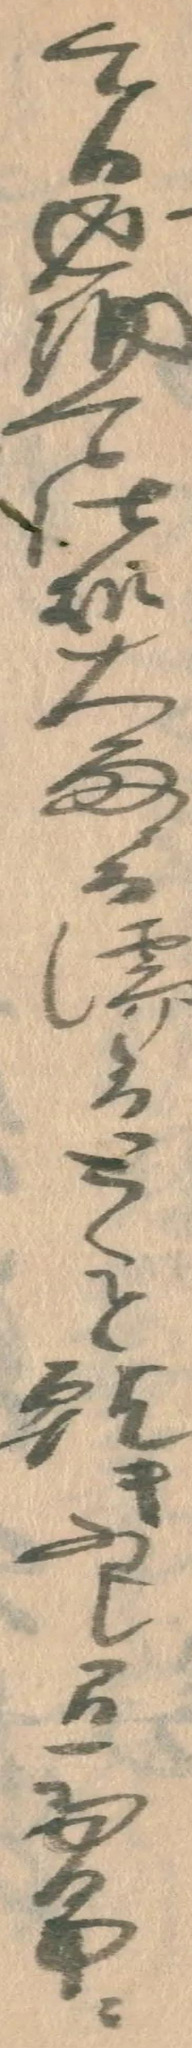今日返納可仕処大雨ニ而濡候而とくと乾キ不申候間一両日中ニ
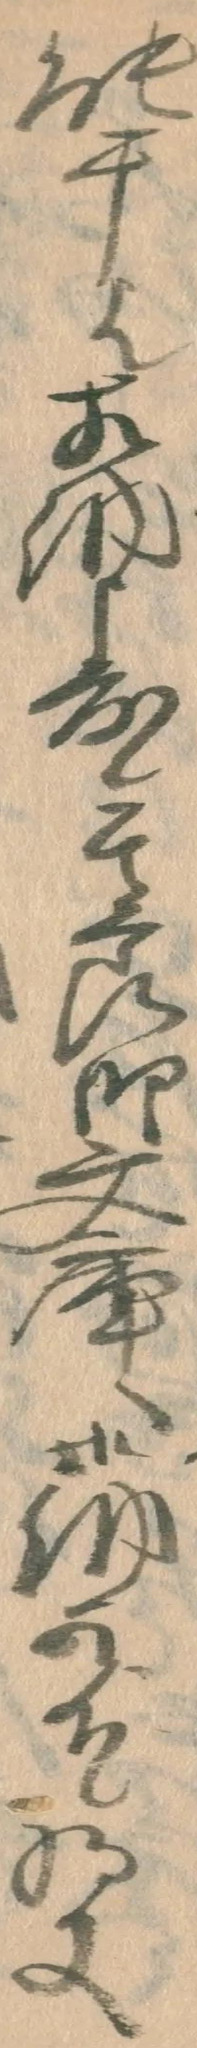能干申て相納申度候其節御文庫へ御納可被下候将又
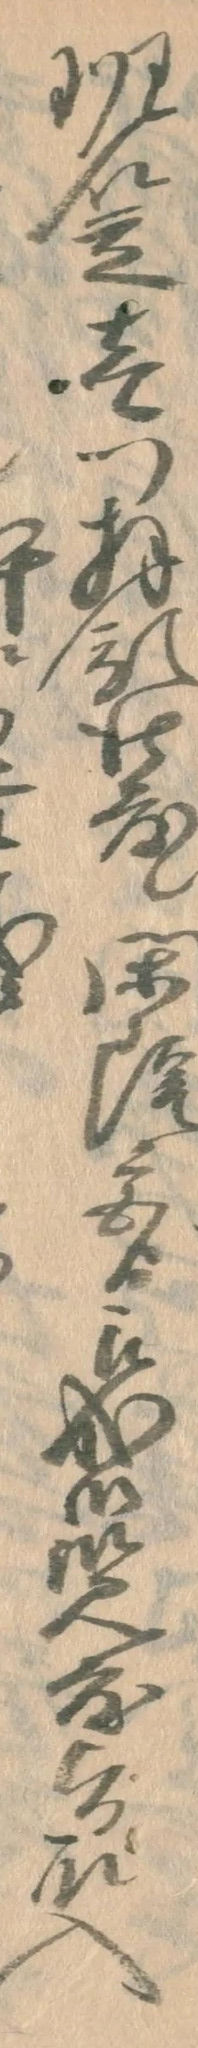班笠壱ツ拝領仕度候閑院宮ゟ被成御覧度旨故入
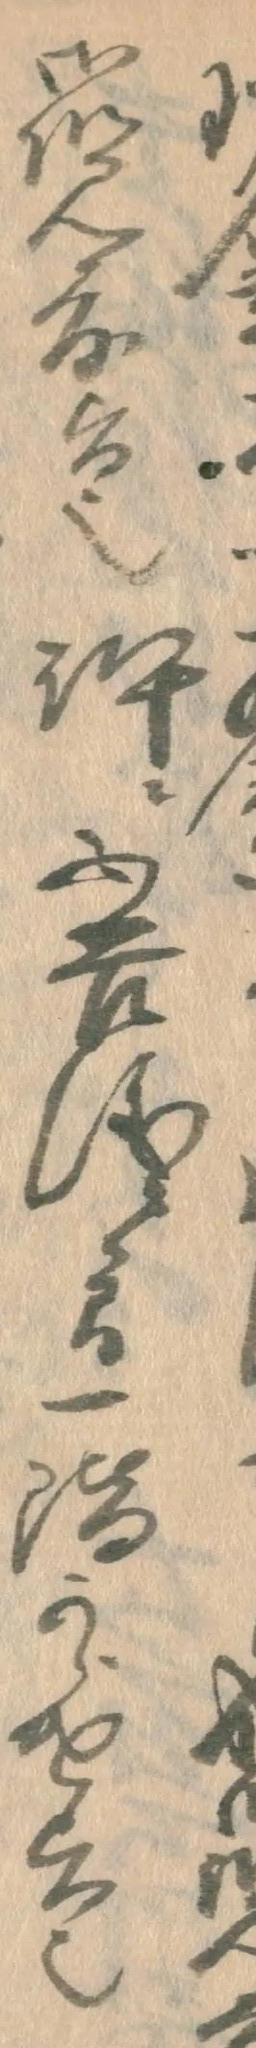御覧度旨也評ニ不苦儀ニ候間一階可被遣旨也
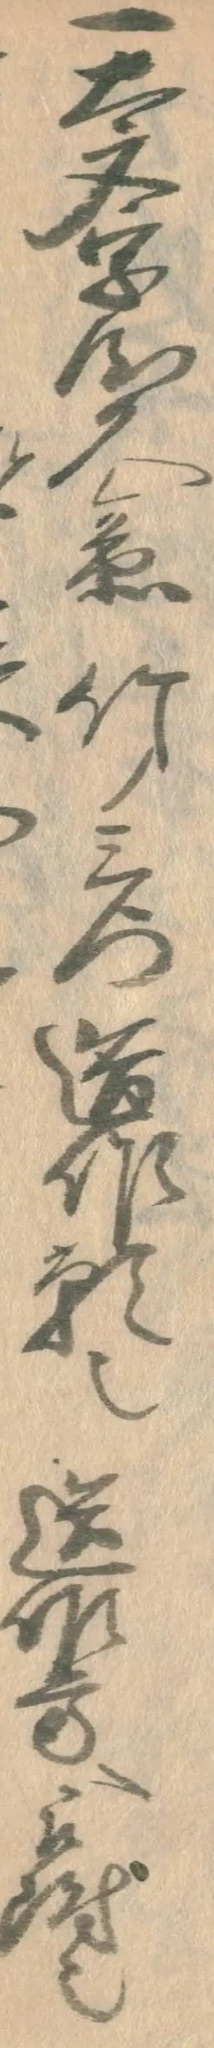一大文字屋久兵衛竹ノ三右衛門造作願也造作方へ被附也
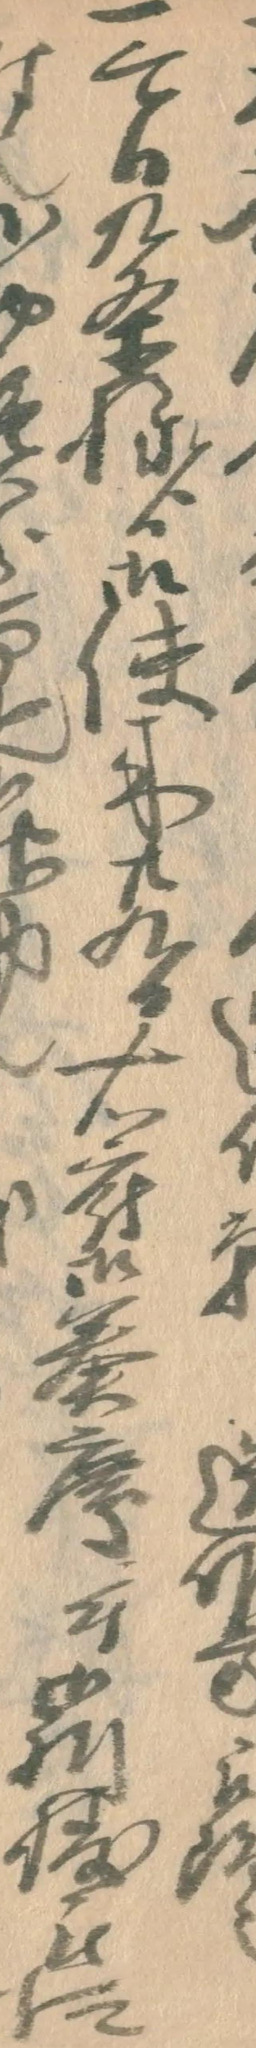一今日九条様ゟ御使来廿九日右府御奏慶ニ付御祈祷被仰
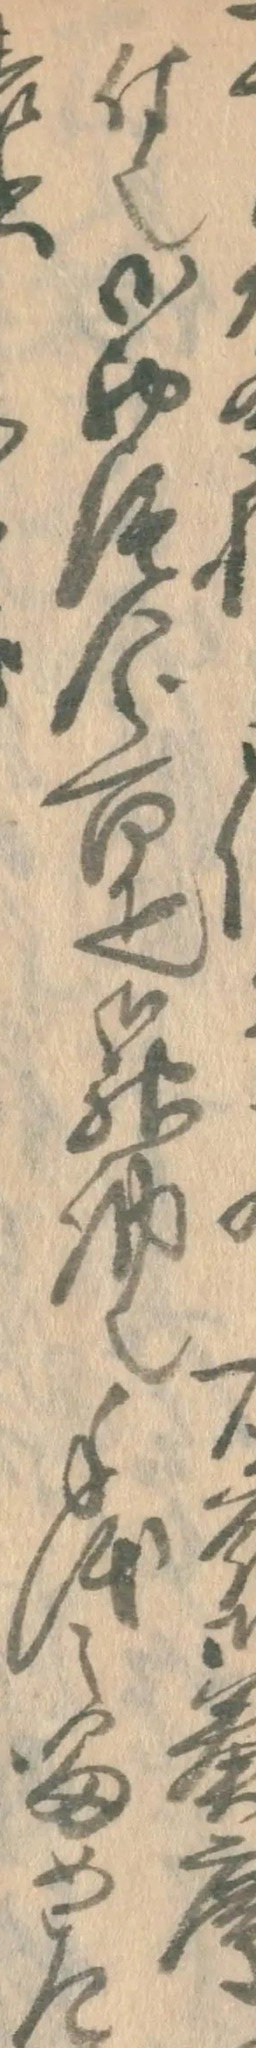付也御初尾金百疋御神納也手紙之留め左
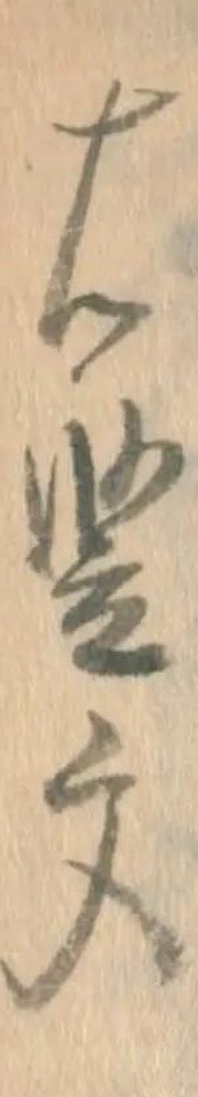右竪文

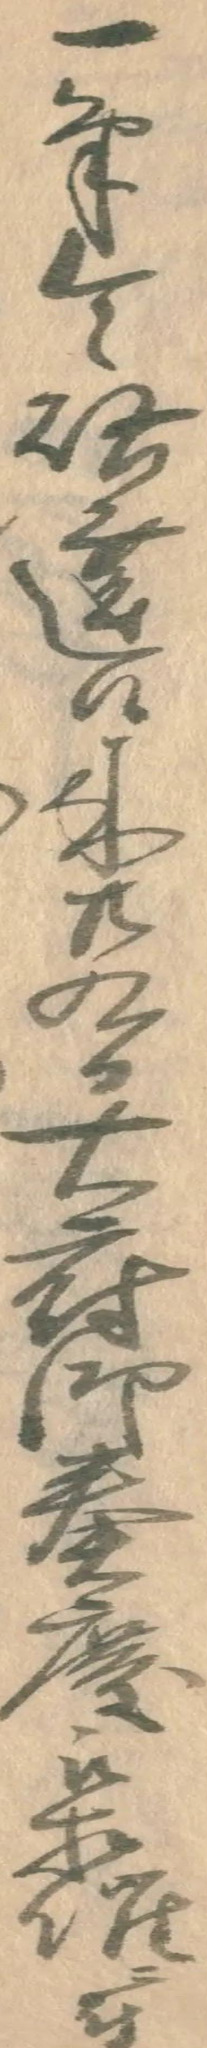一筆令啓達候来廿九日右府御奏慶被相催ニ付
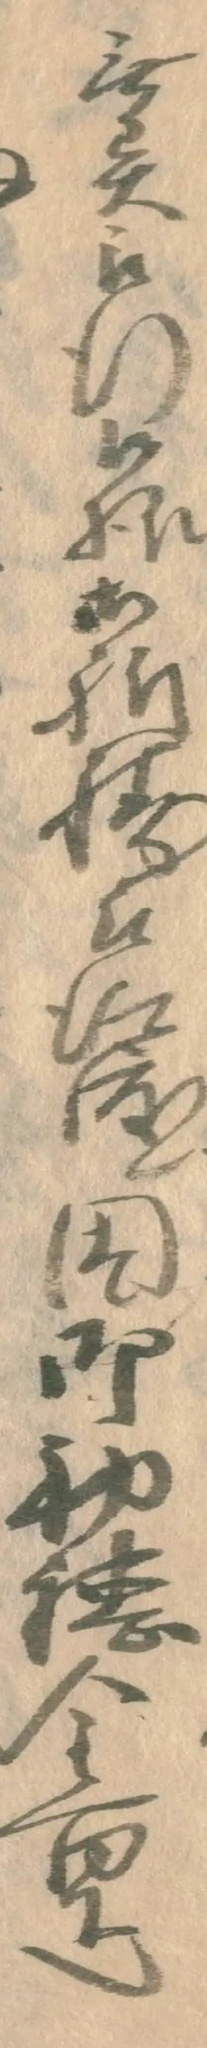無異被行候様御祈祷被仰渡候因御初穂金百疋
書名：賀茂社記録. 第60冊
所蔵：国立国会図書館 National Diet Library, JAPAN
